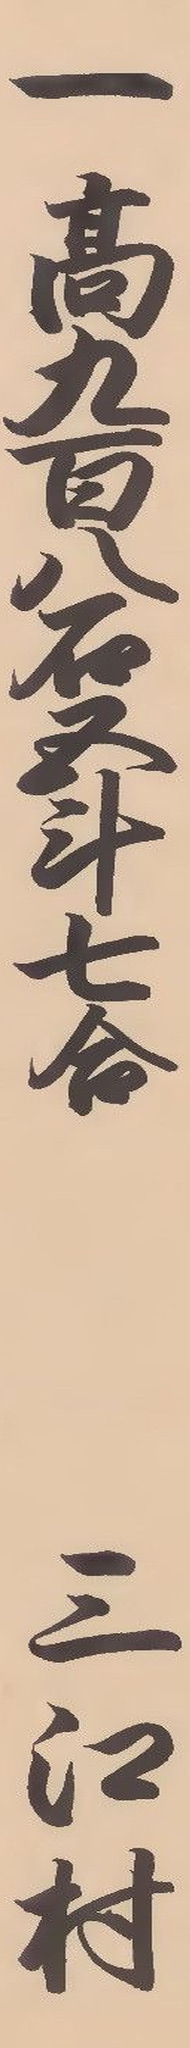一高九百八石五斗七合三江村
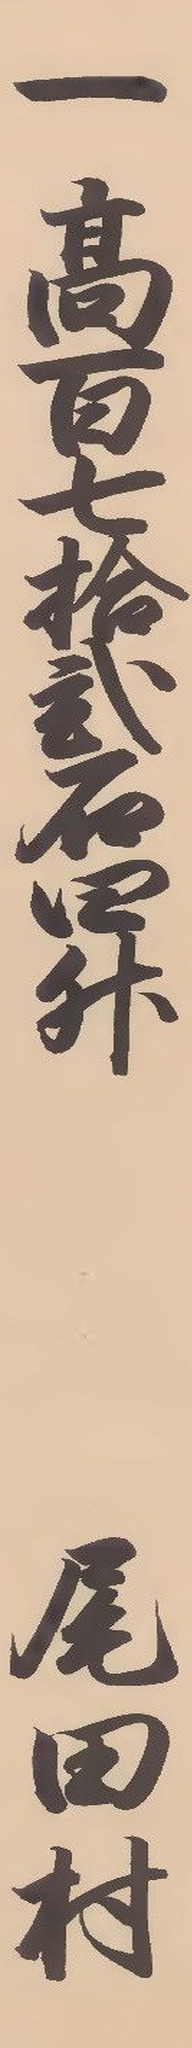一高百七拾弐石四升尾田村
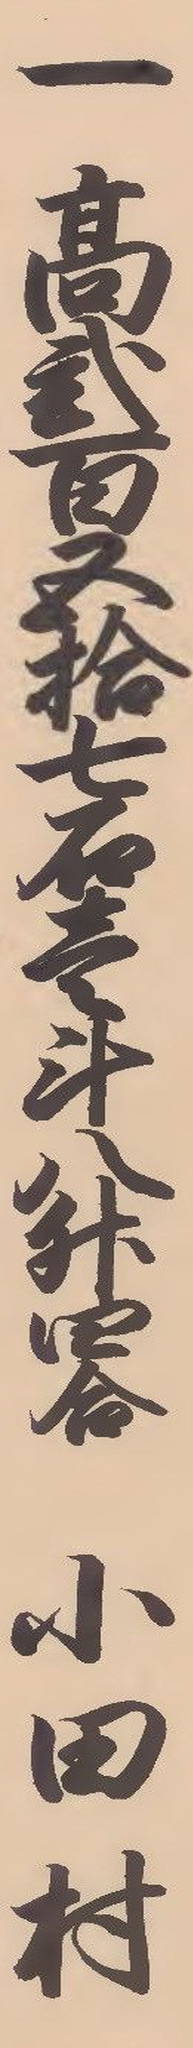一高弐百五拾七石壱斗八升四合小田村

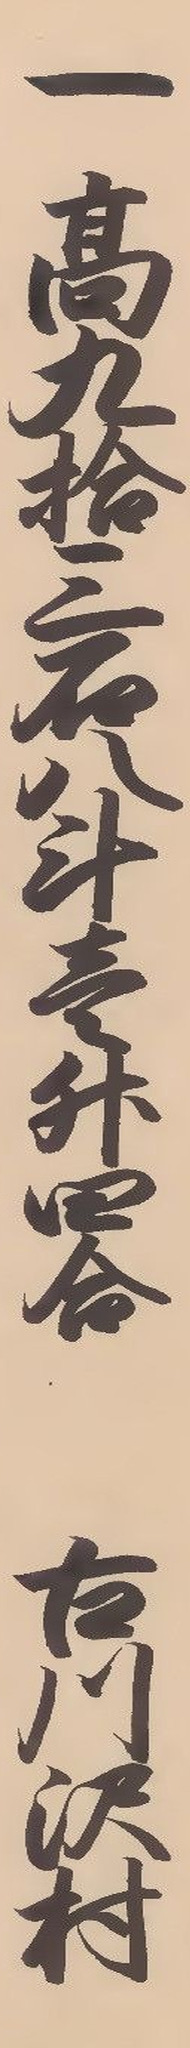一高九拾三石八斗壱升四合古川沢村
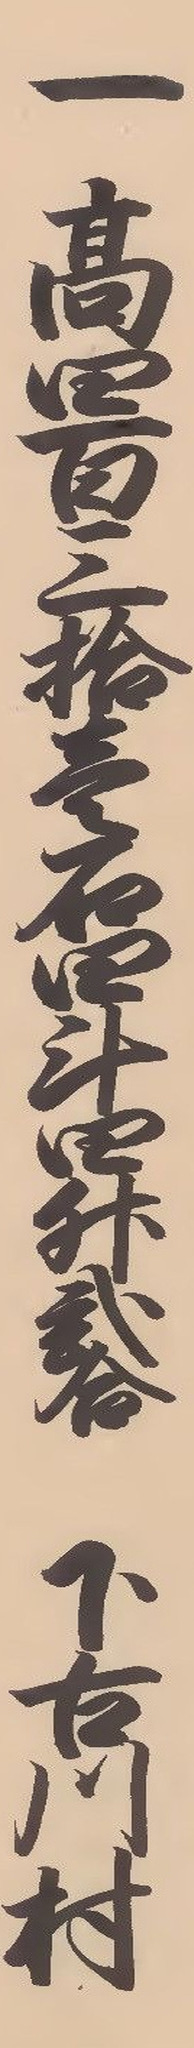一高四百三拾壱石四斗四升弐合下古川村
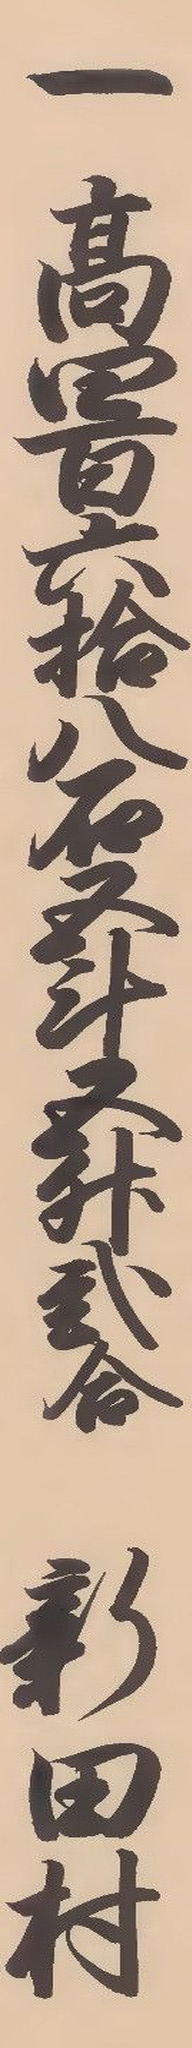一高四百六拾八石五斗五升弐合新田村
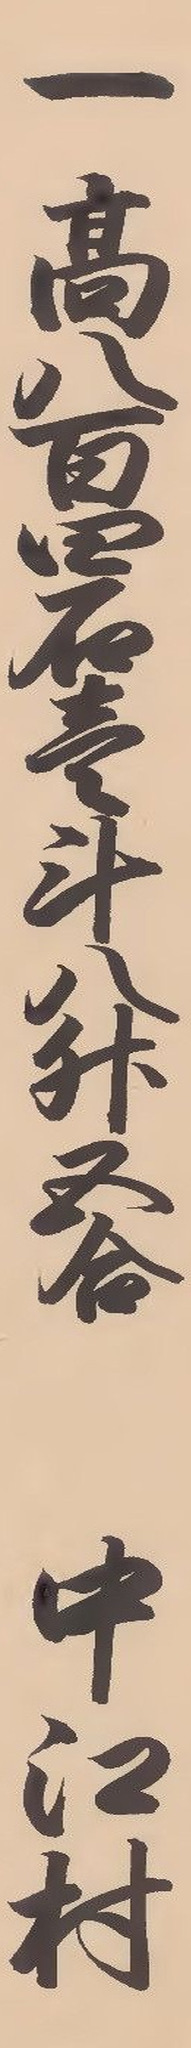一高八百四石壱斗八升五合中江村
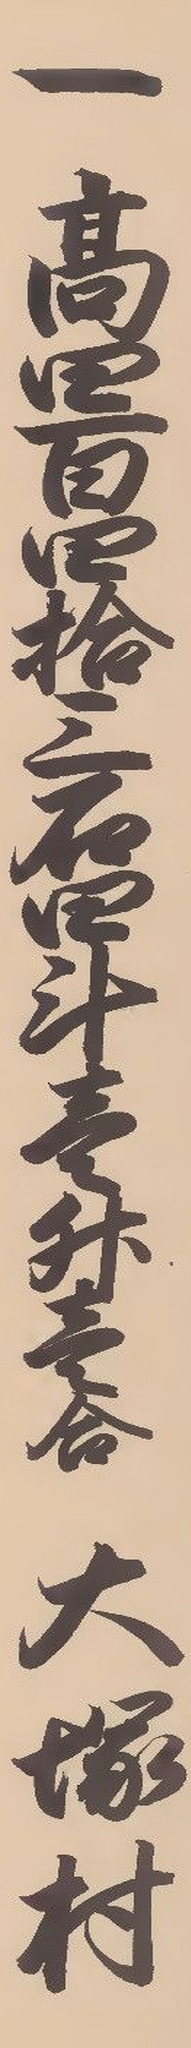一高四百四拾三石四斗壱升壱合大塚村
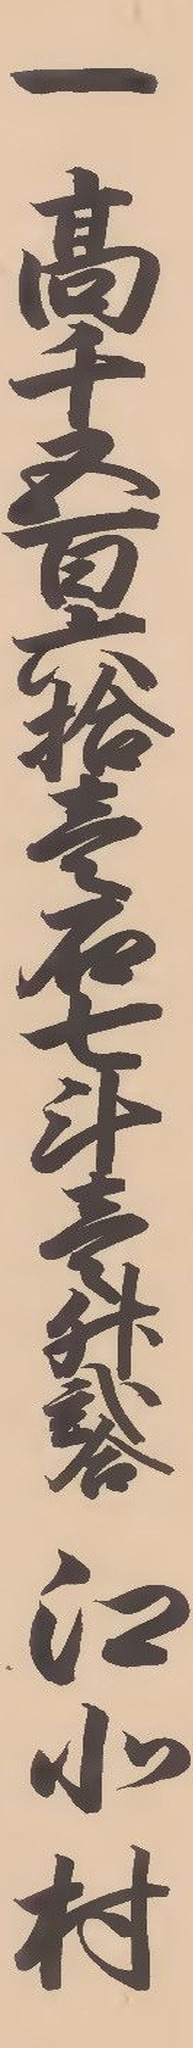一高千五百六拾壱石七斗壱升弐合江北村
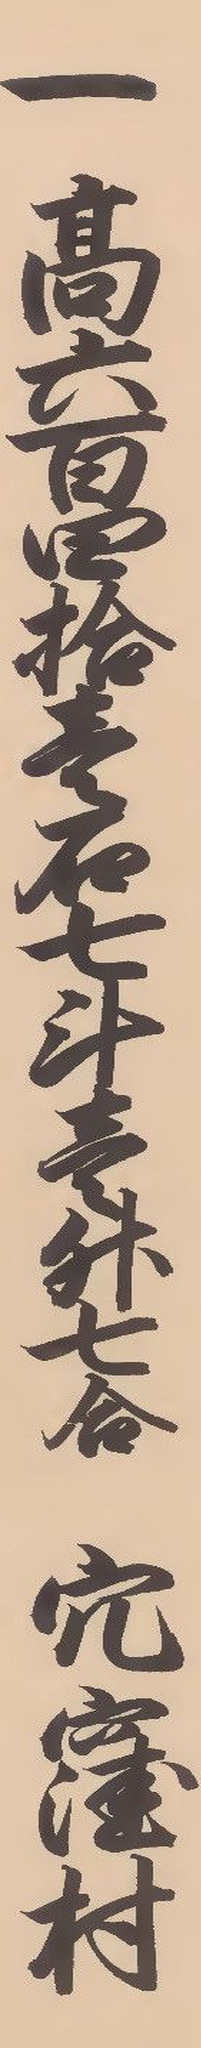一高六百四拾壱石七斗壱升七合穴窪村
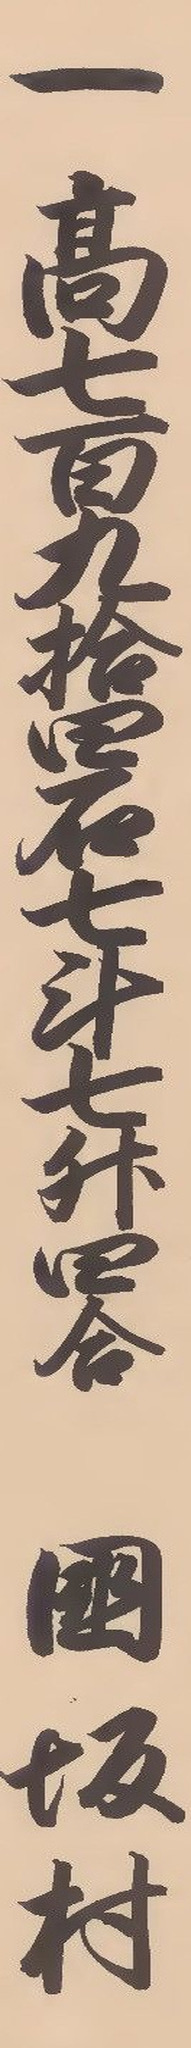一高七百九拾四石七斗七升四合国坂村

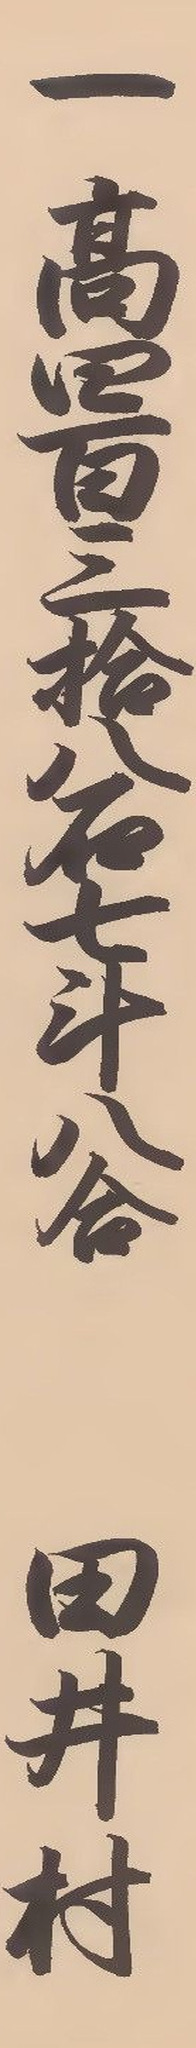一高四百三拾八石七斗八合田井村
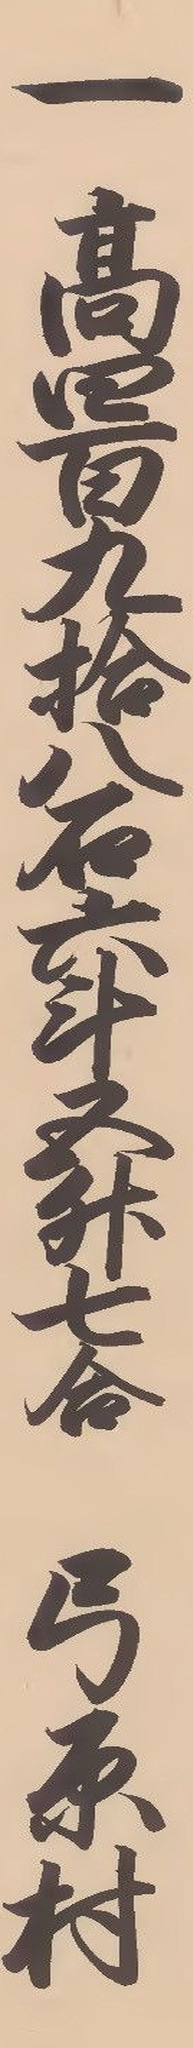一高四百九拾八石六斗五升七合弓原村
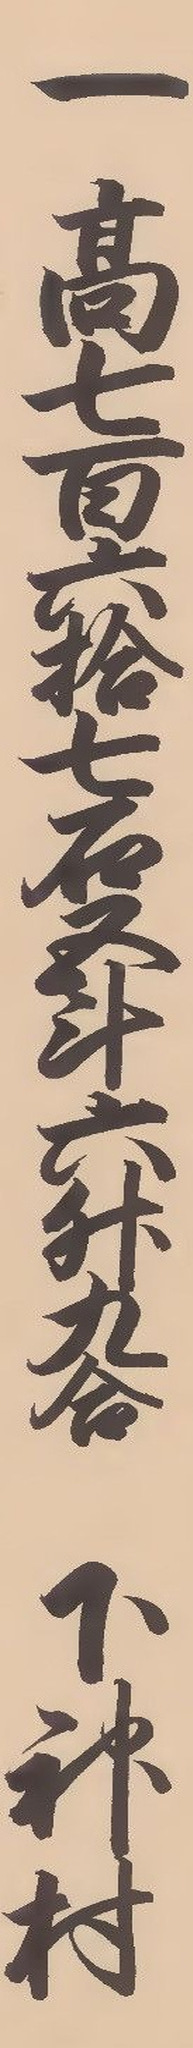一高七百六拾七石五斗六升九合下神村
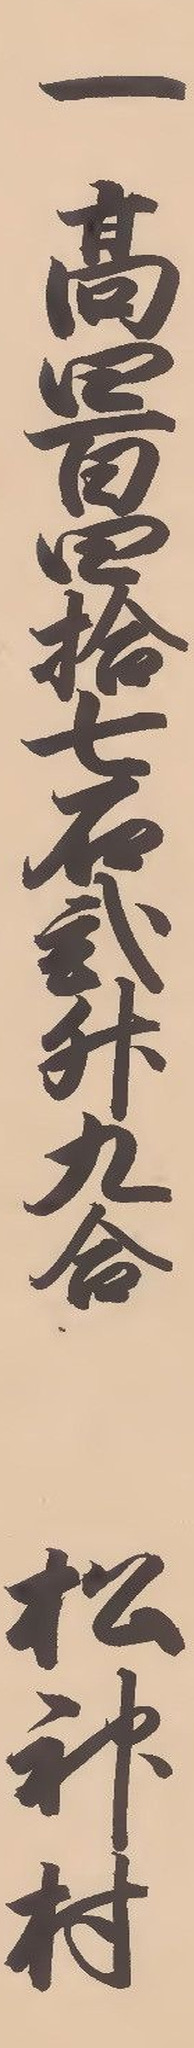一高四百四拾七石弐升九合松神村
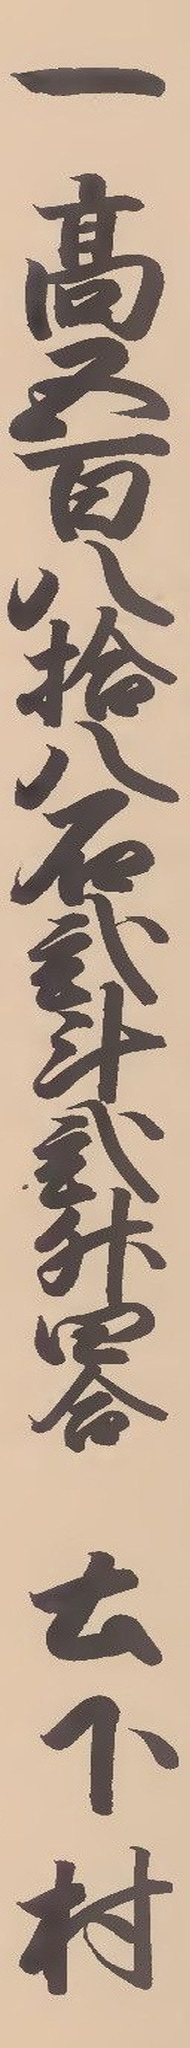一高五百八拾八石弐斗弐升四合土下村
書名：伯耆国郷帳
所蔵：国立公文書館 National Archives of Japan
